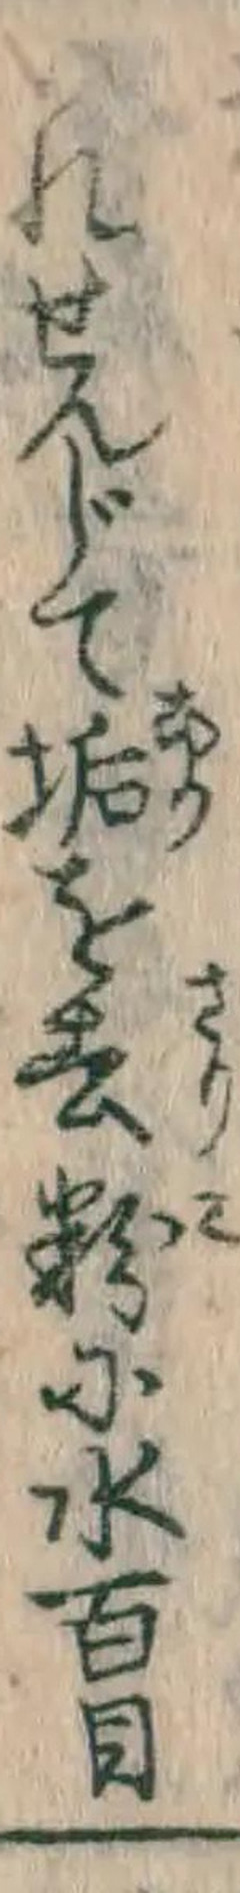いれせんじて垢を去粉に水百目
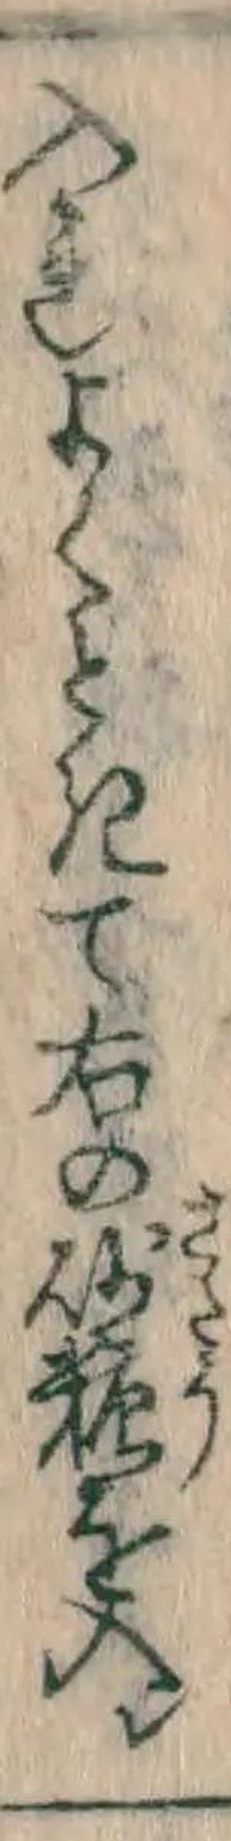入れよくときて右の砂糖を入れ
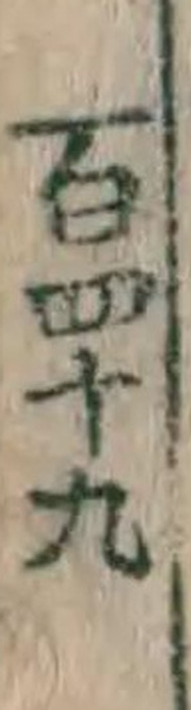百四十九

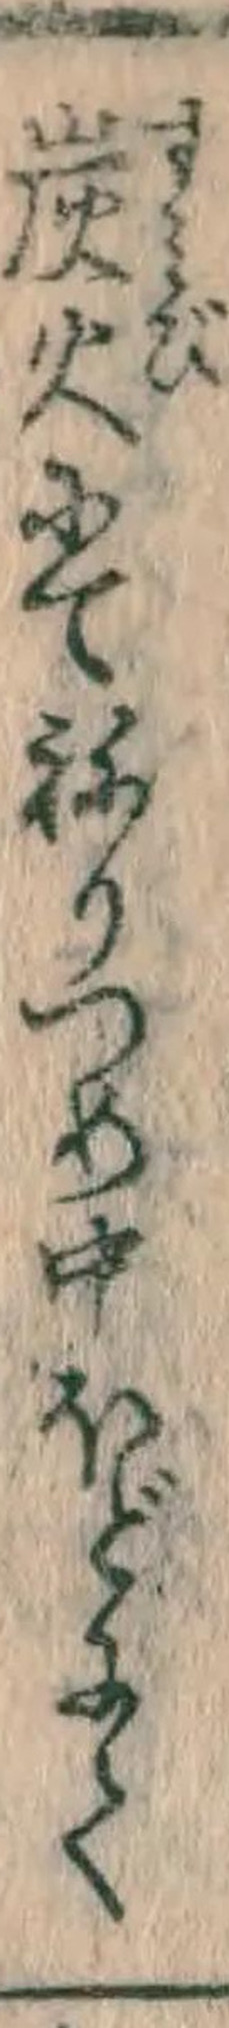炭火にてねりつめ中ほどにて
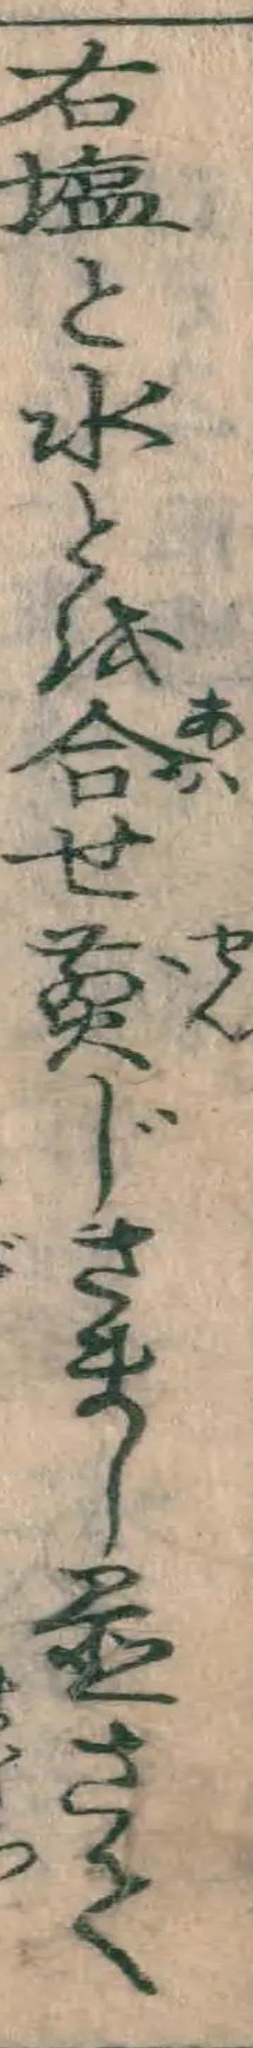右塩と水とを合せ煎じさまし置さて
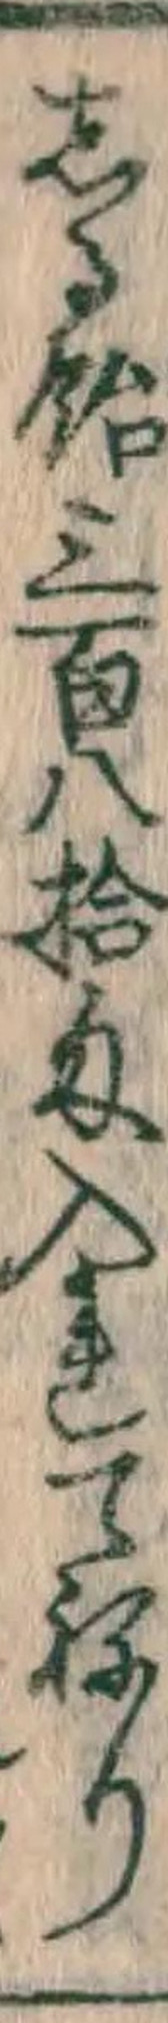しる飴三百八拾匁入れてねり
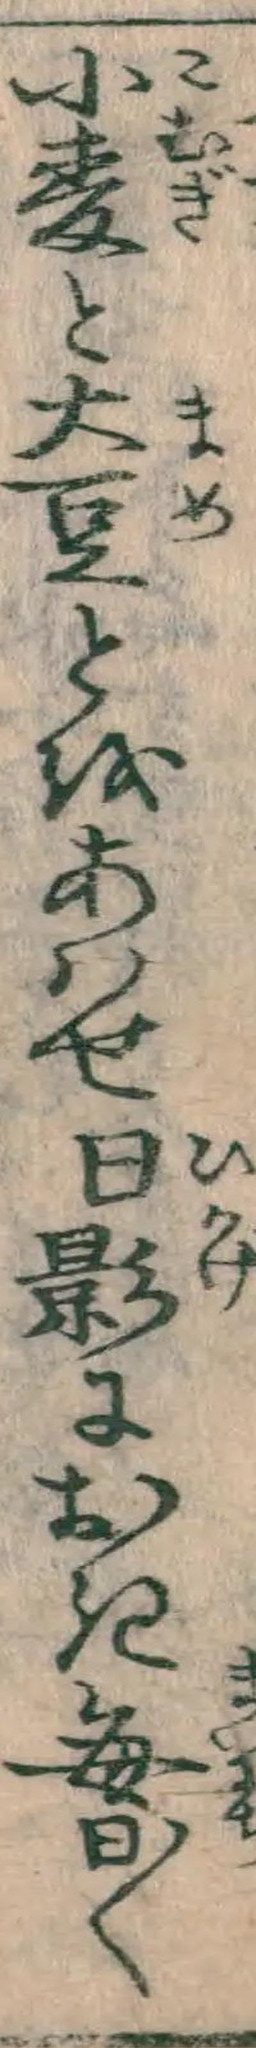小麦と大豆とをあはせ日影におき毎日〳〵
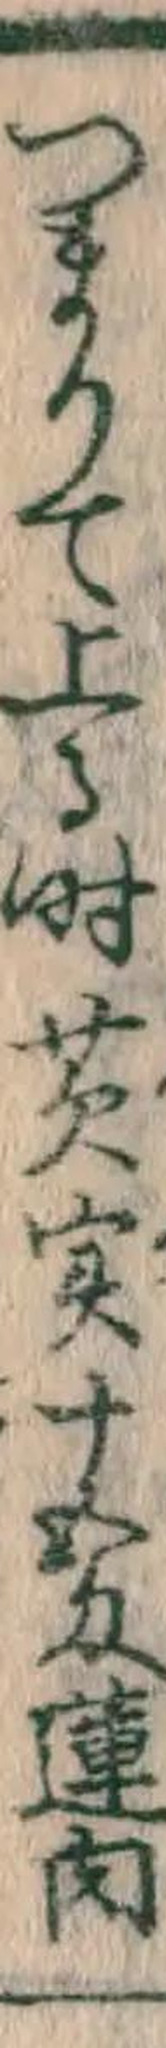つまりて上る時芡実十五匁蓮肉
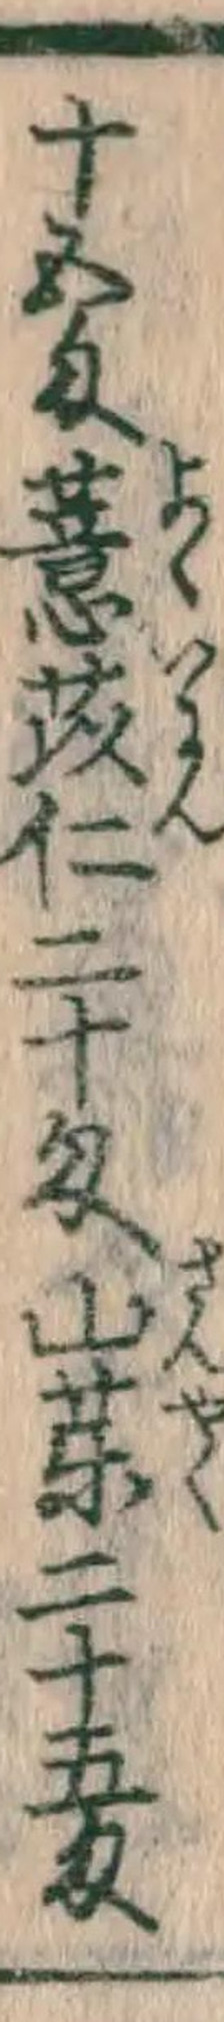十五匁薏苡仁二十匁山薬二十五匁
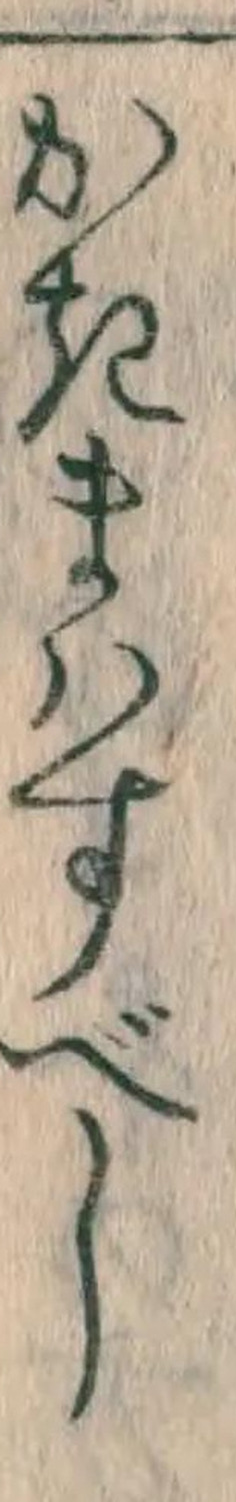かきまはすべし
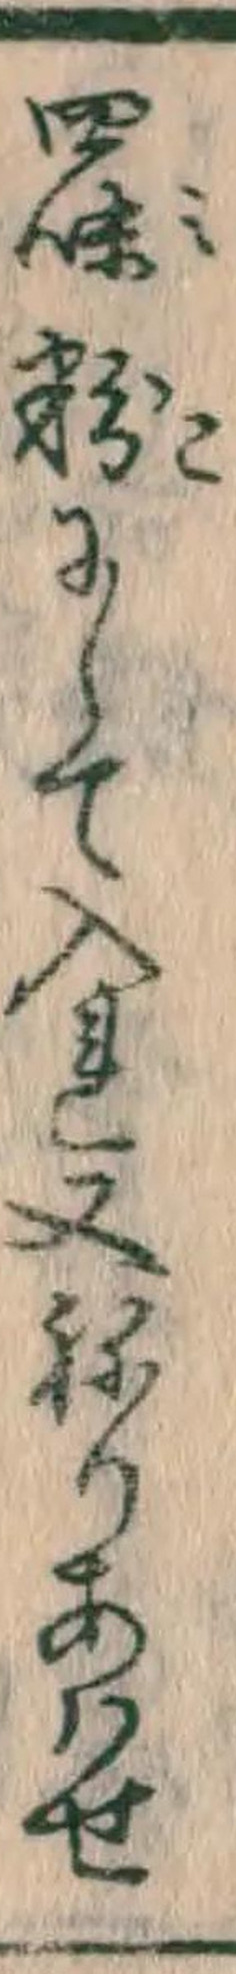四味粉にして入れ又ねりあはせ
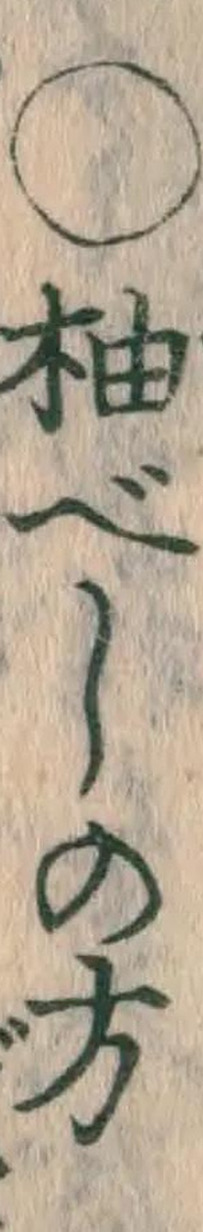○柚べしの方
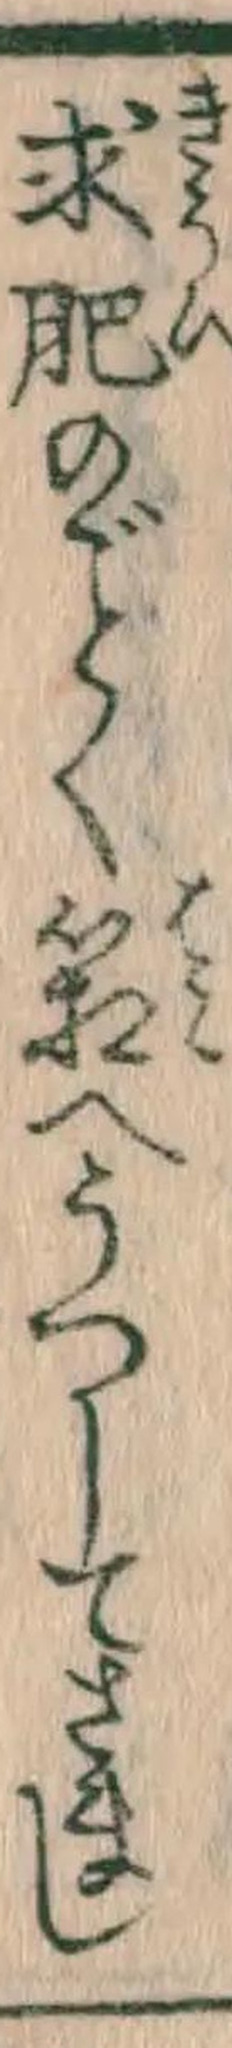求肥のごとく箱へうつしてさまし
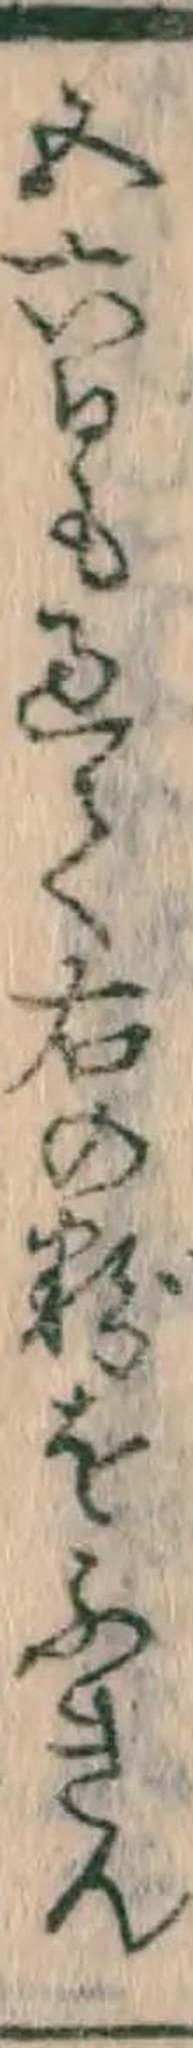五六日も過て右の粉をふきん
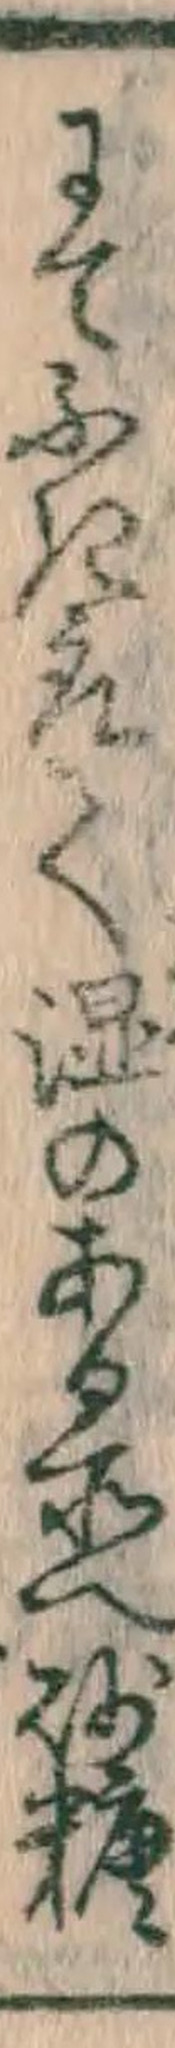にてふき取て湿のある所へ砂糖
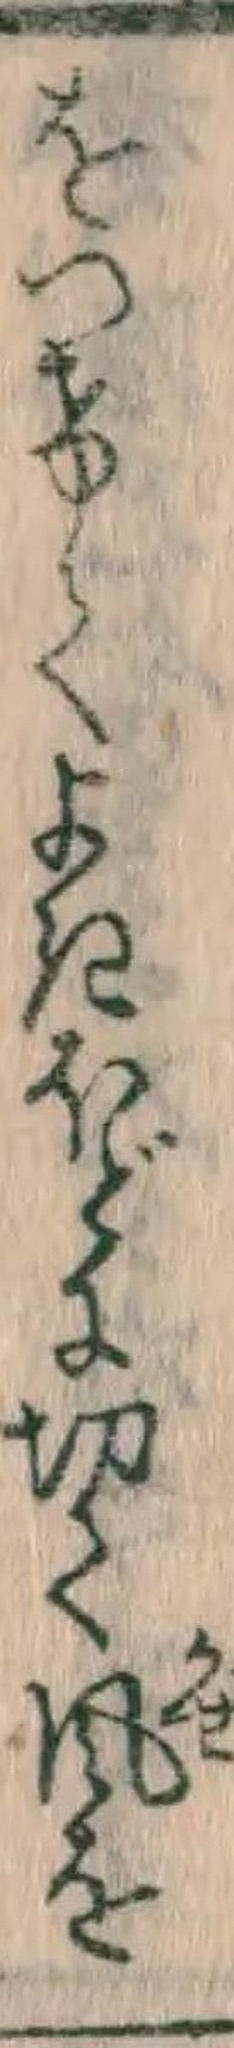をつけてよきほどに切て風を
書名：広益秘事大全 3巻. [5]
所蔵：国立国会図書館 National Diet Library, JAPAN
